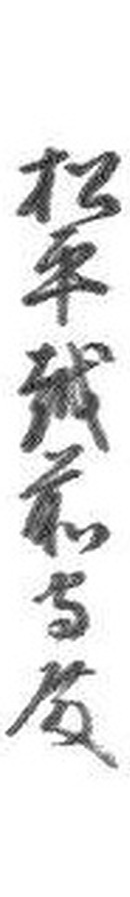松平越前守殿
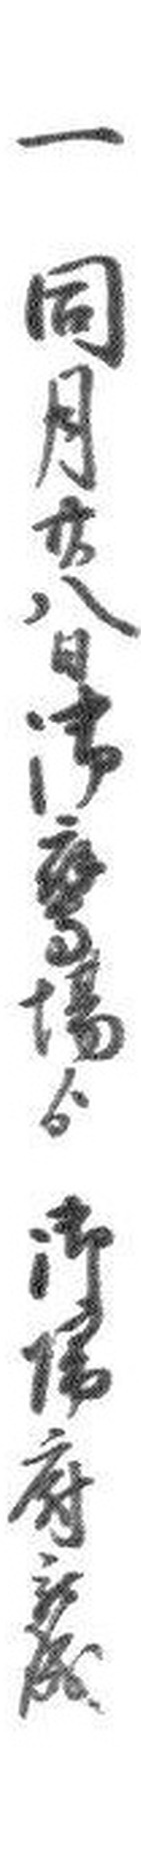一同月廿八日御鷹場ゟ御帰府被成
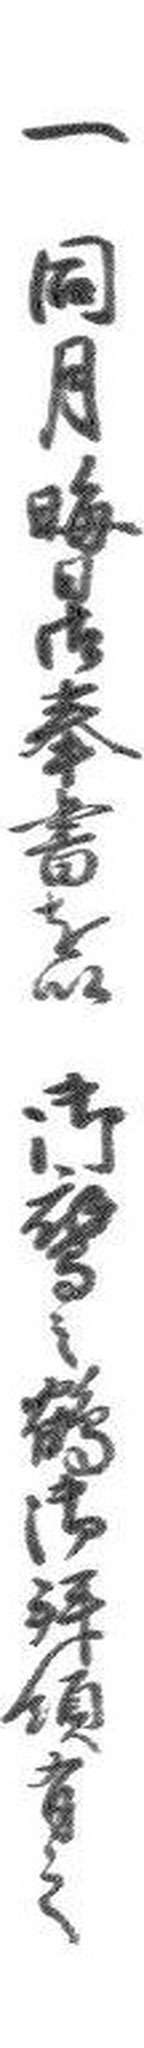一同月晦日御奉書を以御鷹之鶴御拝領有之
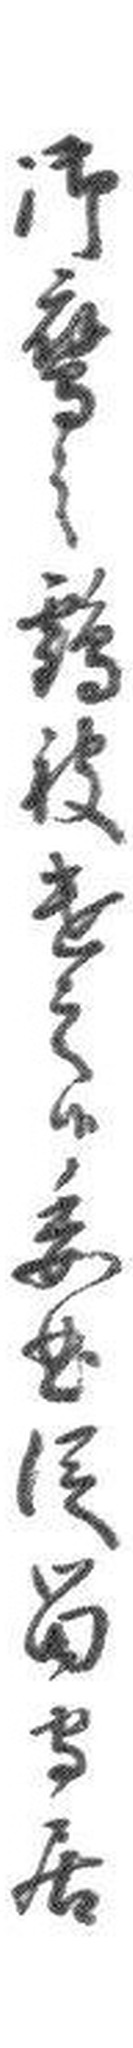御鷹之鶴被遣之候委曲従留守居

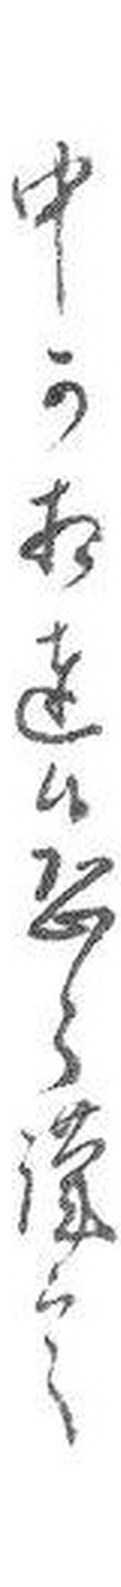中可相達候恐々謹言
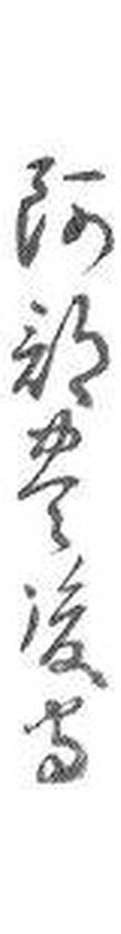阿部豊後守
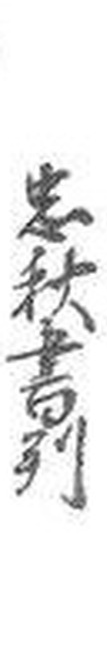忠清書判
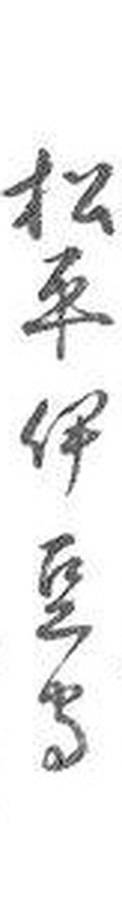松平伊豆守
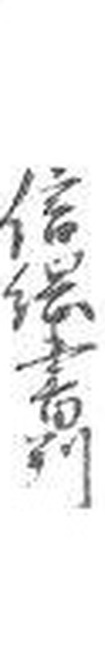信綱書判
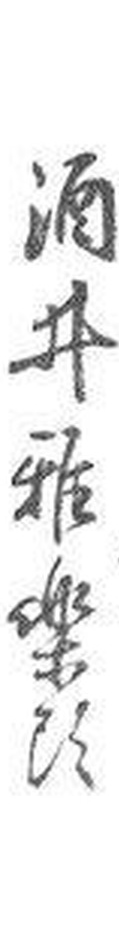酒井雅樂頭
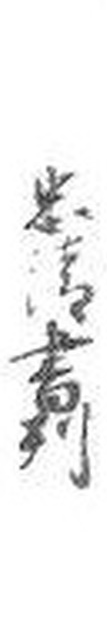忠清書判
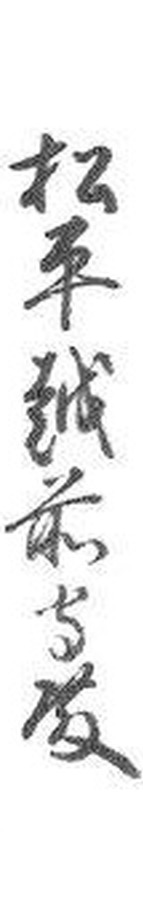松平越前守殿
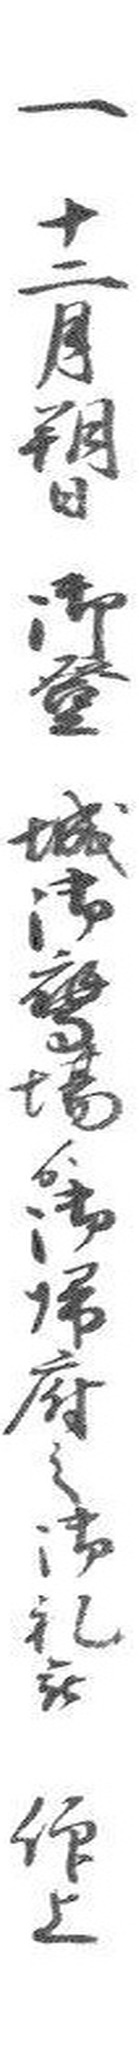一十二月朔日御登城御鷹場ゟ御帰府之御礼被仰上
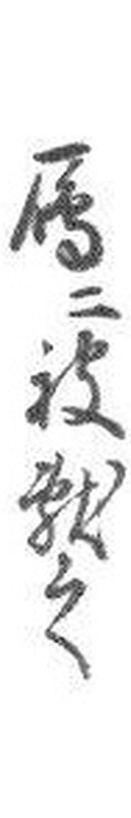雁二被献之
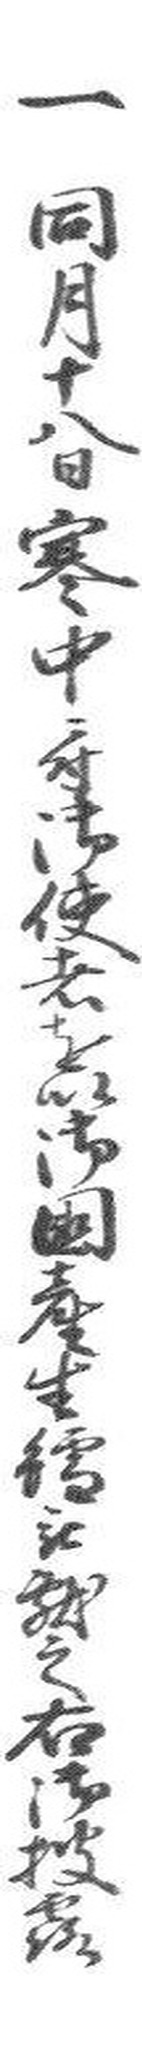一同月十八日寒中ニ付御使者を以御国産生鱈被献之右御披露
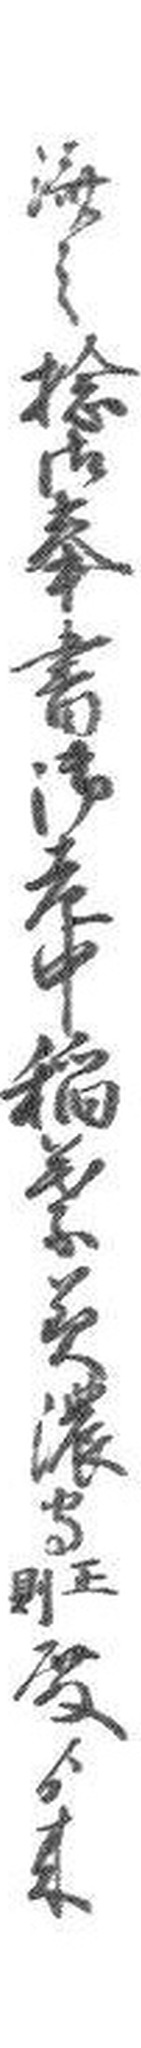済之捻御奉書御老中稲葉美濃守正則殿ゟ来
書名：家譜 六 光通公 従万治三年到寛文三年
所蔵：福井県文書館 Fukui Prefectural Archives
